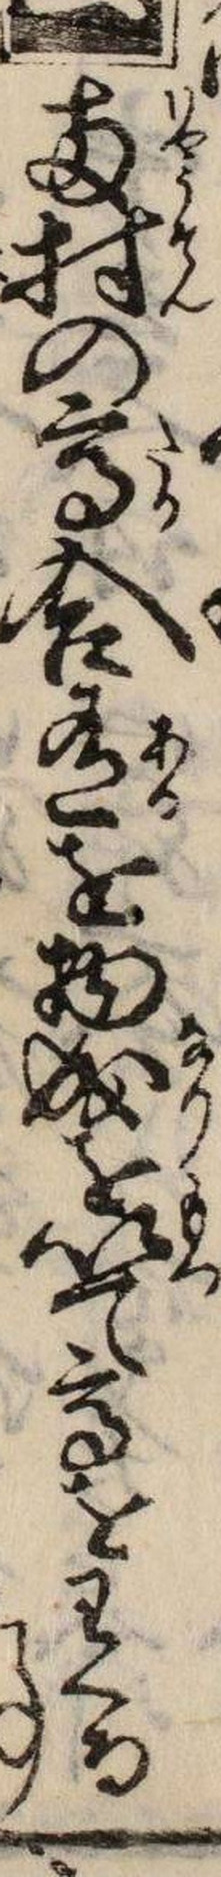両村の高合有を物成を以て高をわくる事
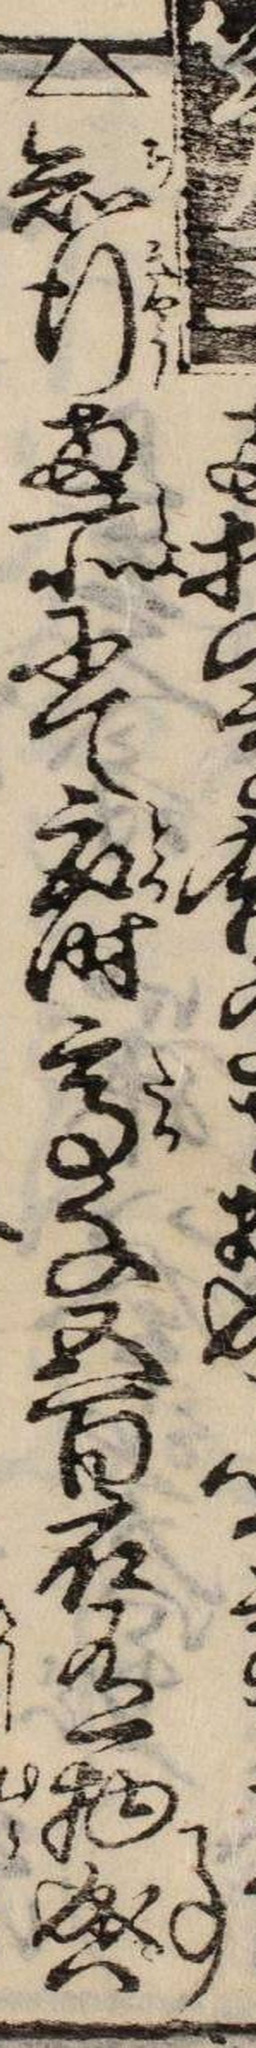△知行両所にて取時高千五百石有物成は
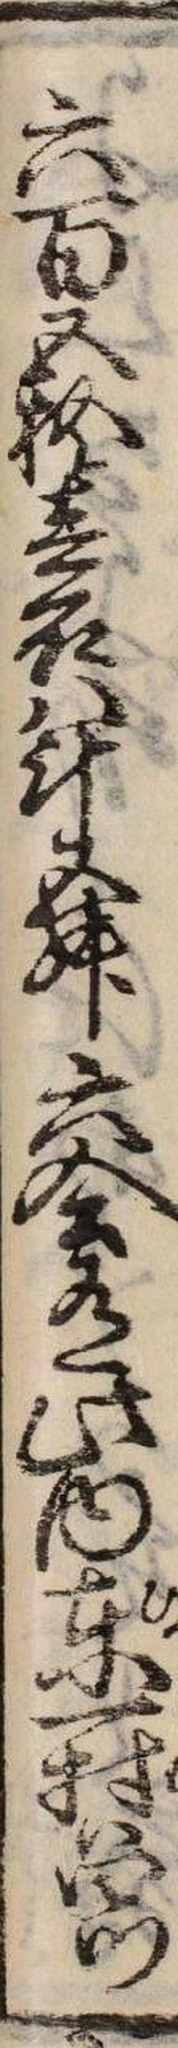六百五拾壱石八斗五升六合有此内東一村四つ
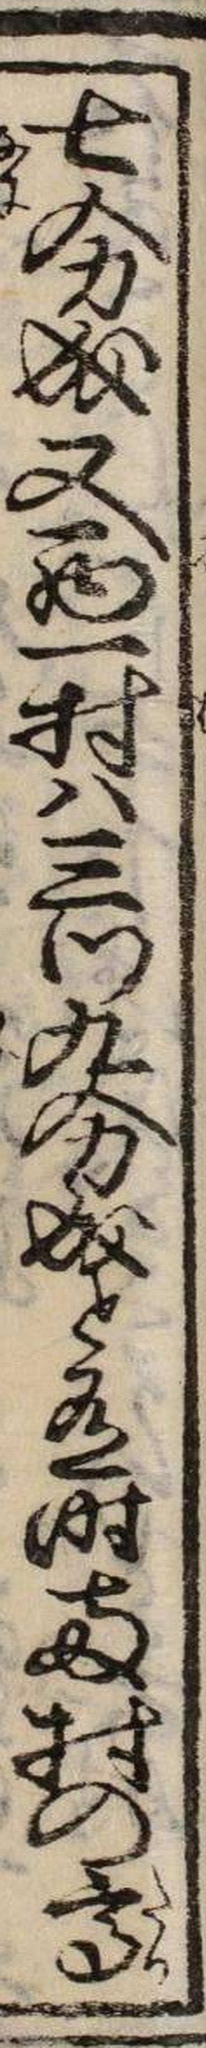七分成又西一村は三つ九分成と有時両村の高
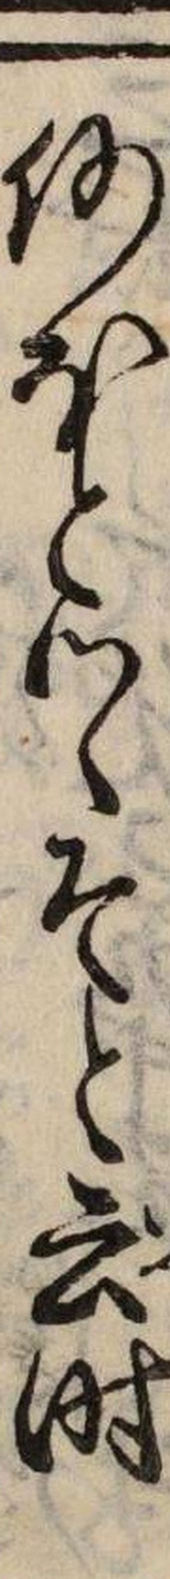何ほとつつそと云時
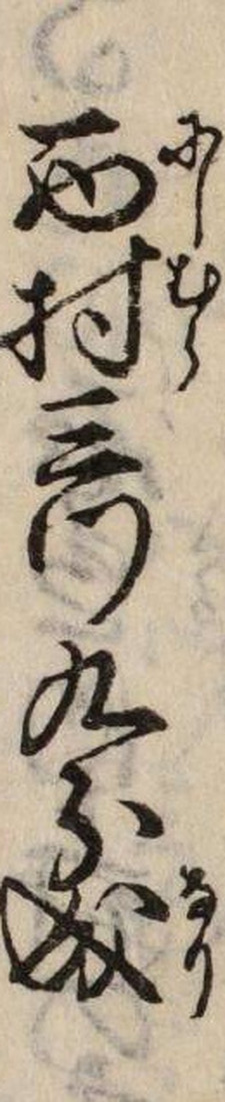西村三つ九分成
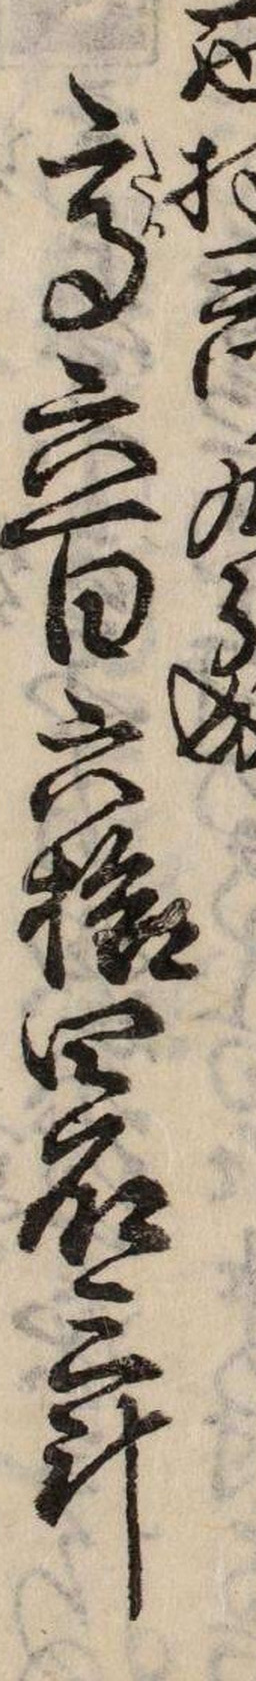高六百六拾四石三斗
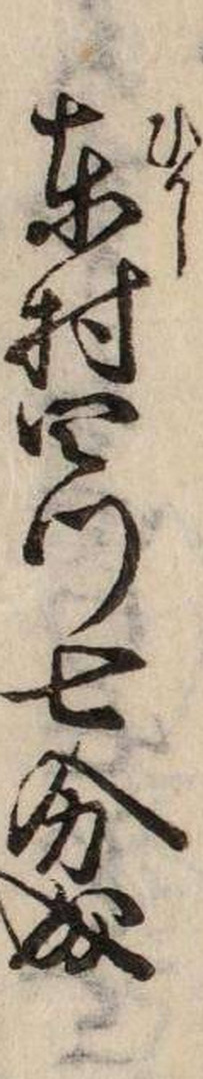東村四つ七分成
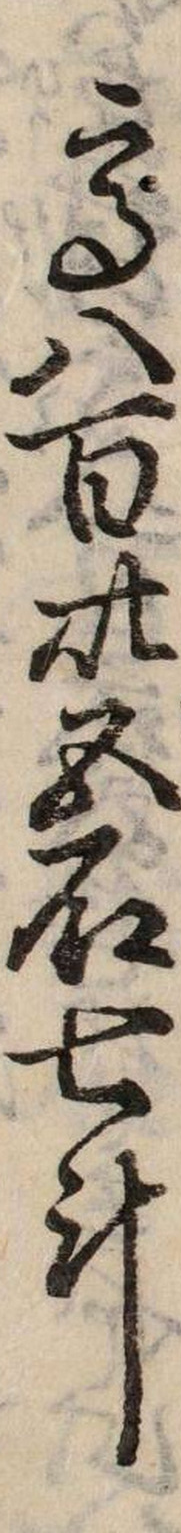高八百卅五石七斗
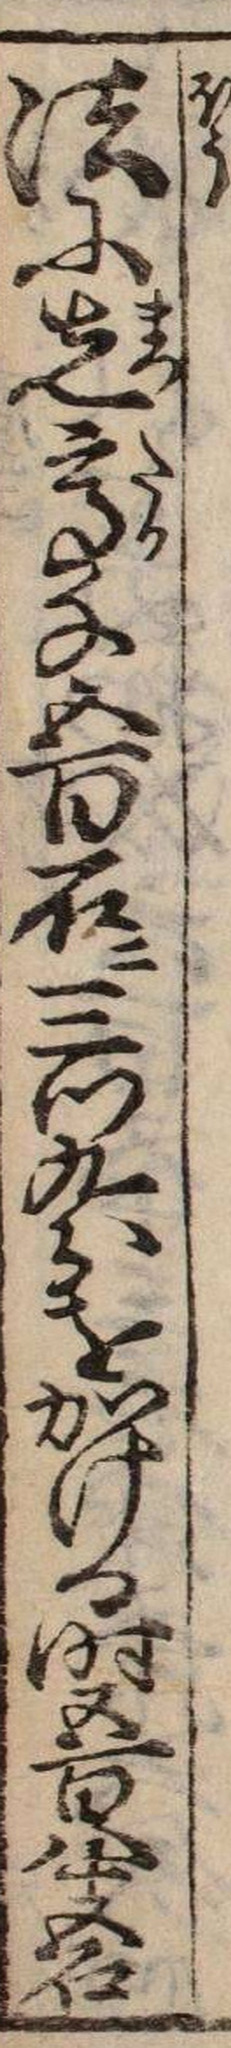法に先高千五百石に三つ九分をかける時五百八十五石

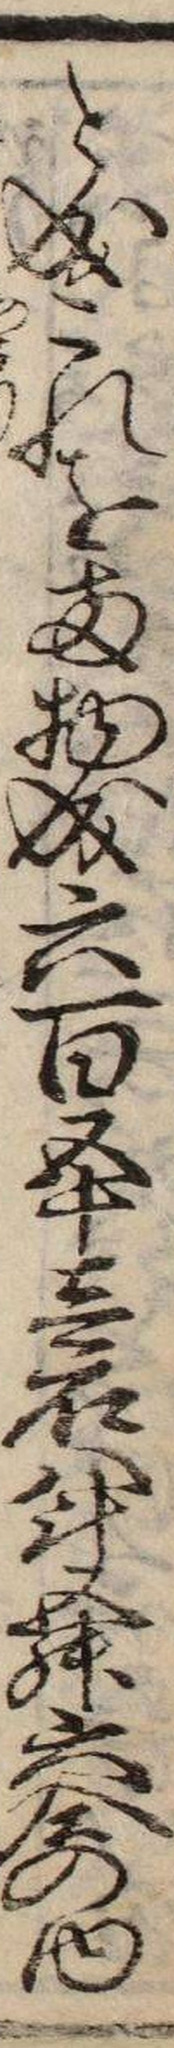と成これを両物成六百五十三石八斗五升六合の内
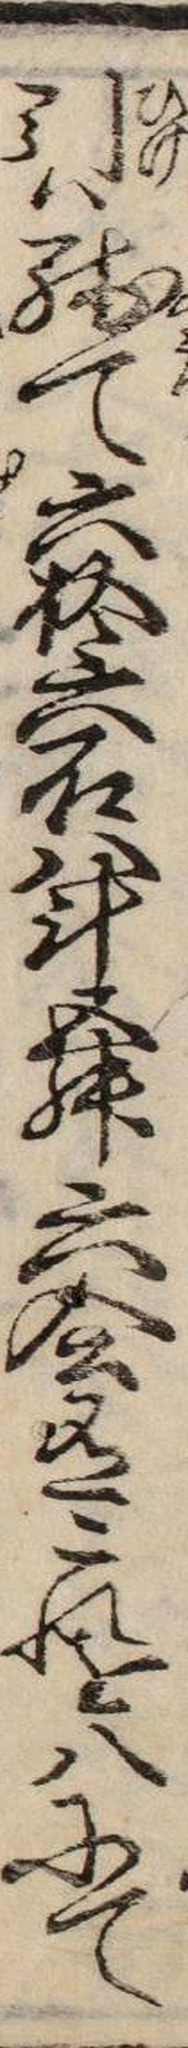引は残て六拾六石八斗五升六合有これを八にて
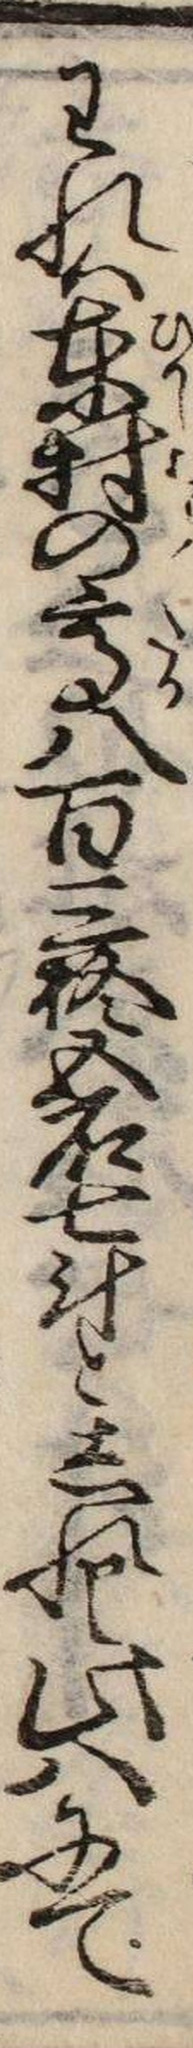われは東村の高八百三拾五石七斗としれ申候此八にて
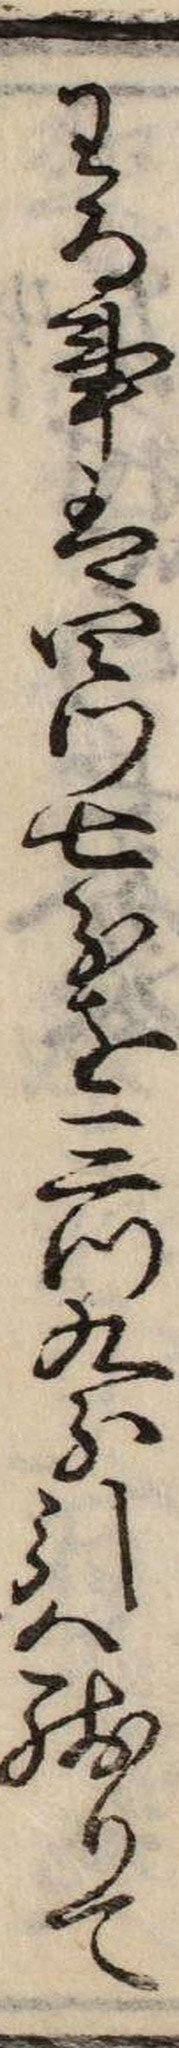わる事は四つ七分を三つ九分引は残りて
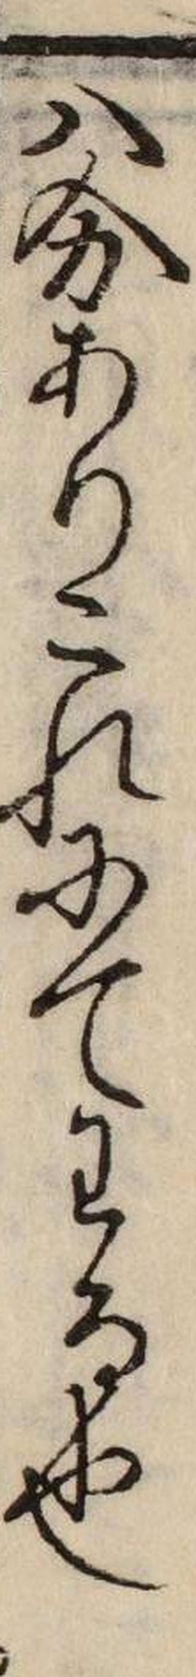八分ありこれにてわる也
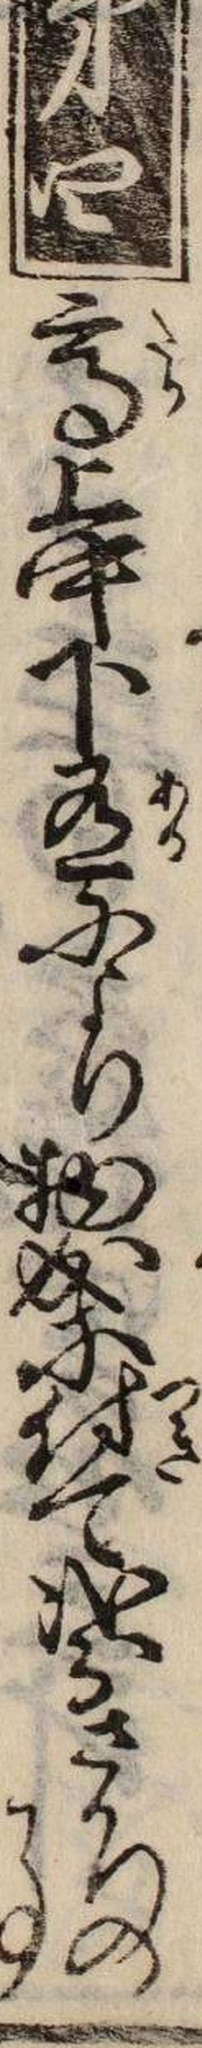第四高上中下有により物成に付て弐分さかりの事
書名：塵劫記（寛永11年自跋、京都府立京都学・歴彩館追貴8）
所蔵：京都府立京都学・歴彩館 国文学研究資料館
